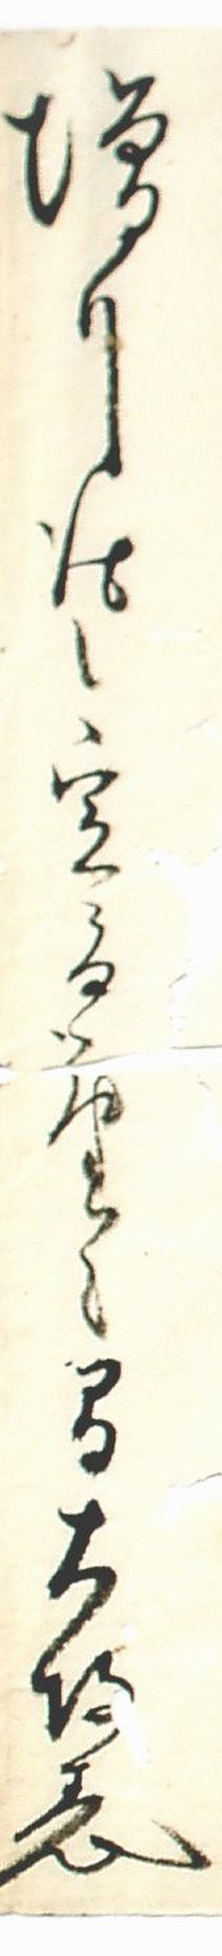増事仕候定に而御坐候間大坂表
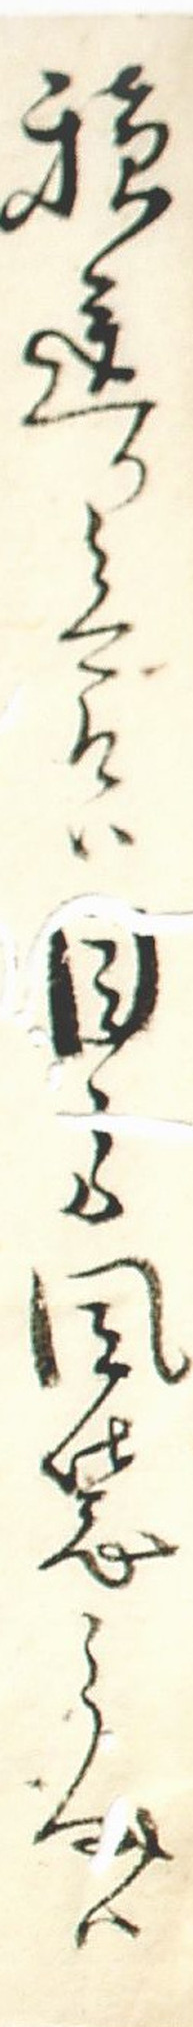積送り之可候は目方風袋之儀は

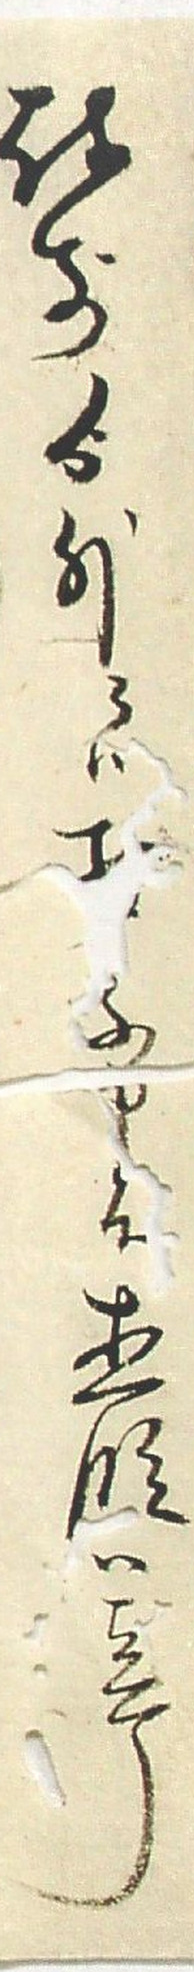残前ゟ外には相不申候直段は壱丁
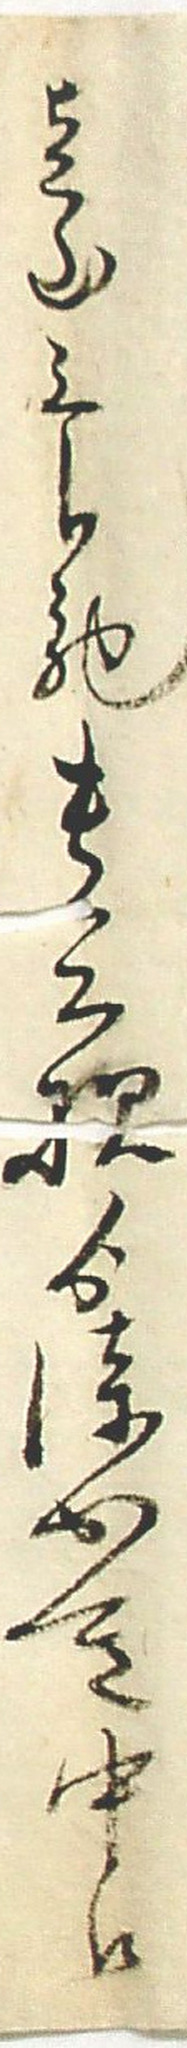壱匁三分馳貴方様ゟ漆かき中え
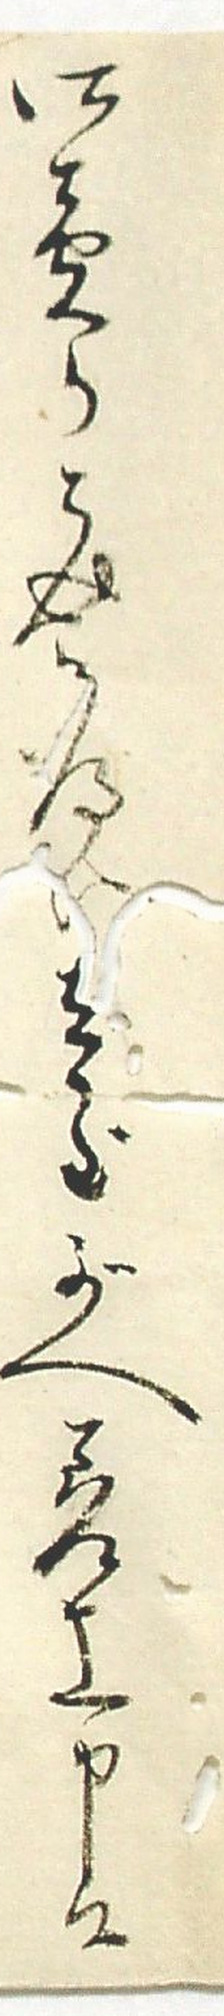御売り被成候得は壱匁がへ差上申候
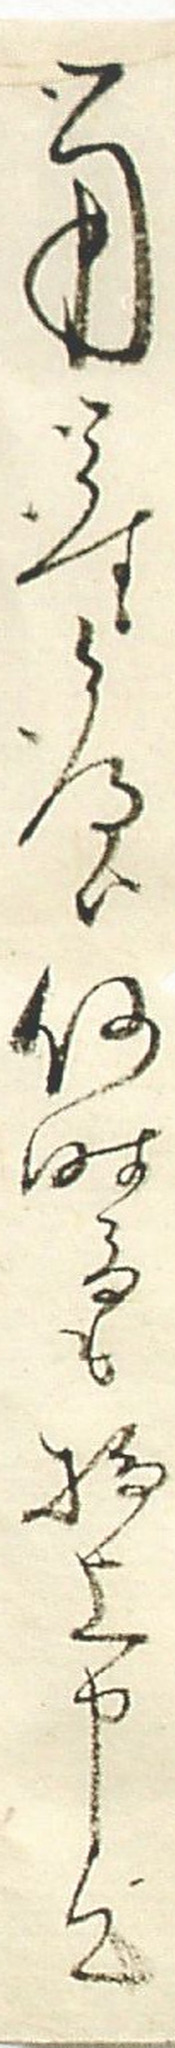御用御坐候得は何時に而も指上申候
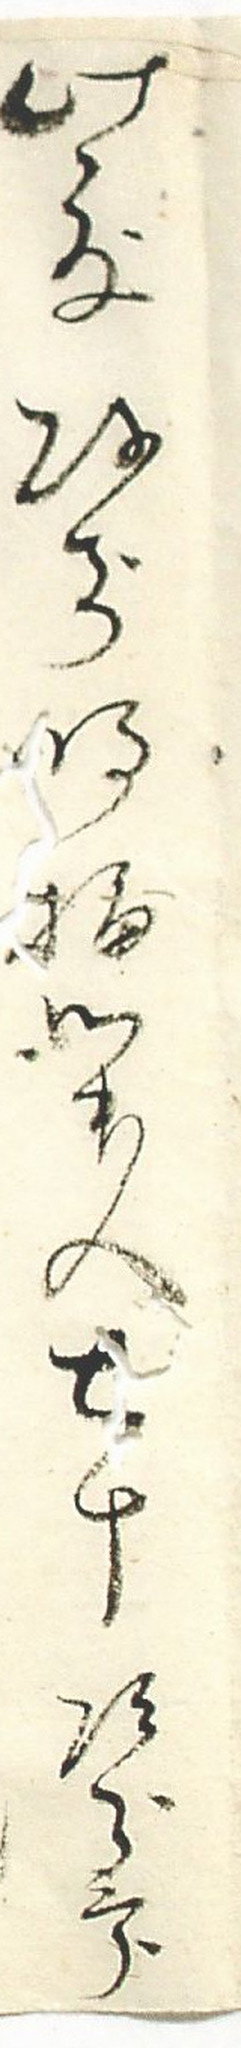此度何分明桶弐升入七十次分三分
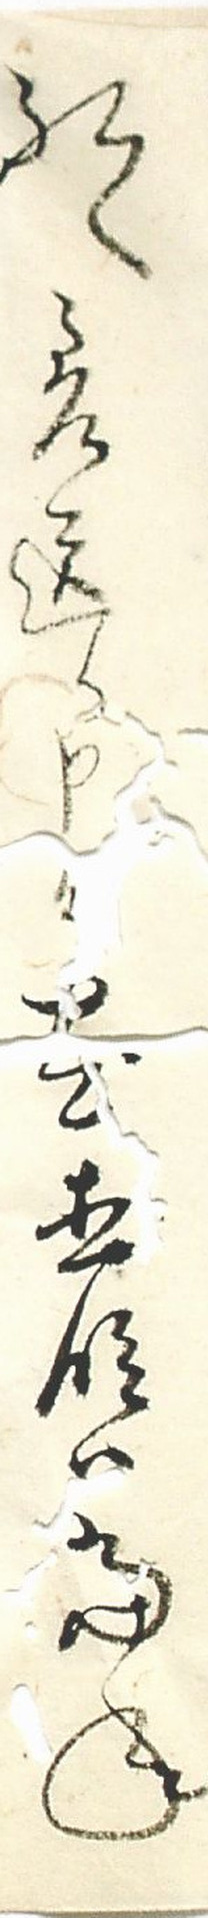船へ差送り申候尤直段は当年
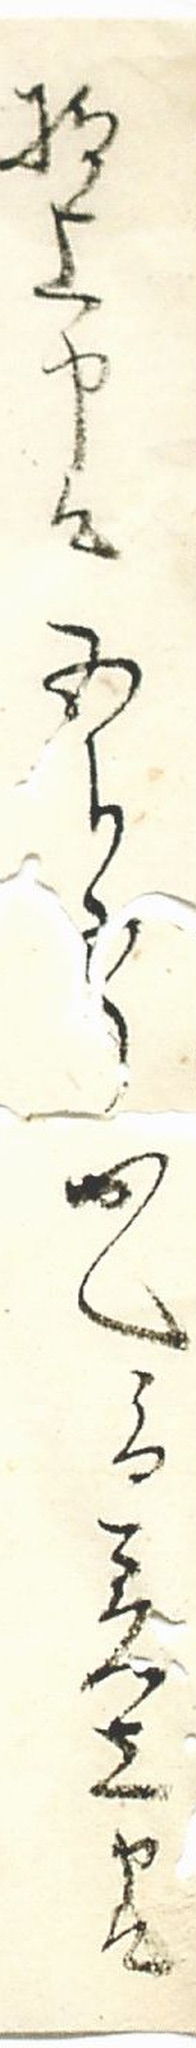指上申候五日分かへに而差上申候
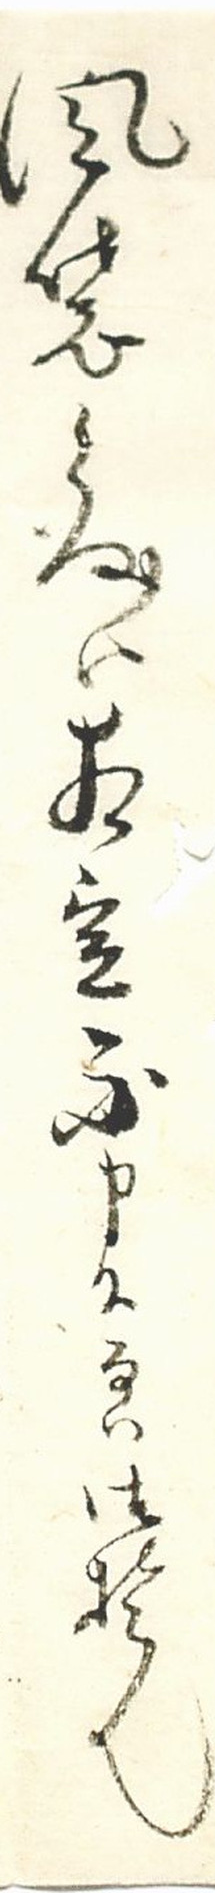風袋之儀は相定不申候而は御指候
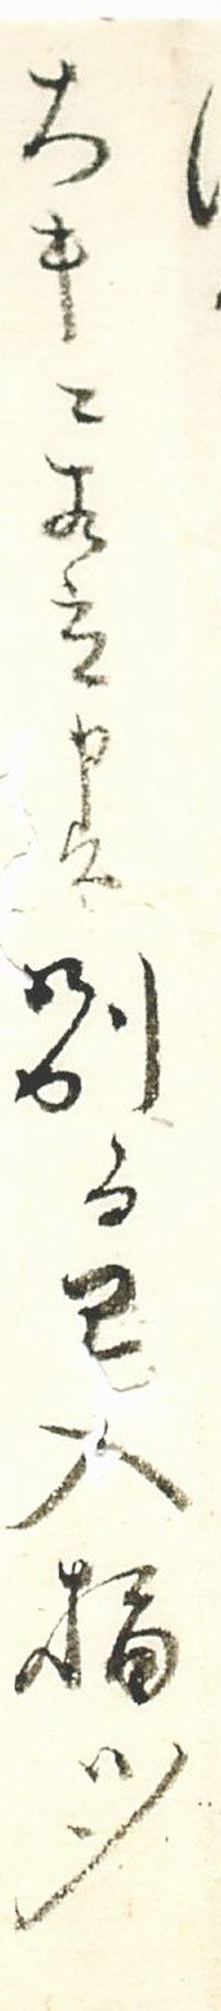大出に相立申候別に而已入桶は〆
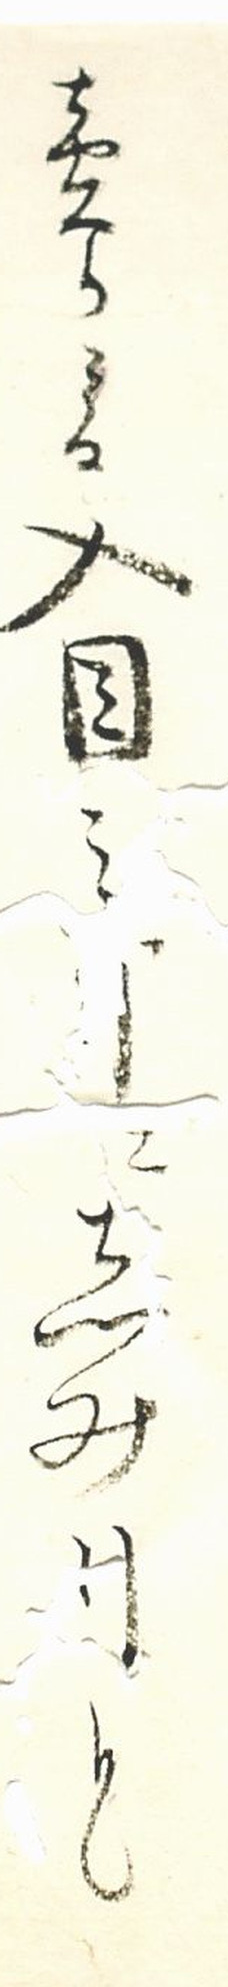売りに而入目之にしみ事申候
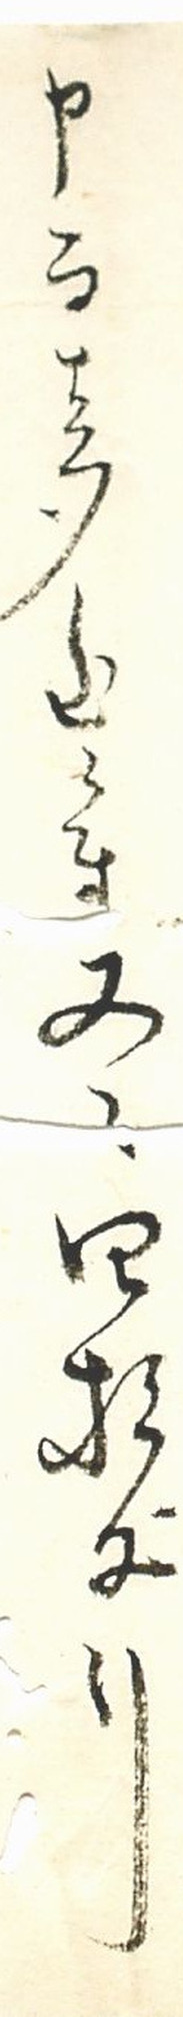申而壱〆匁に付又々四拾匁事
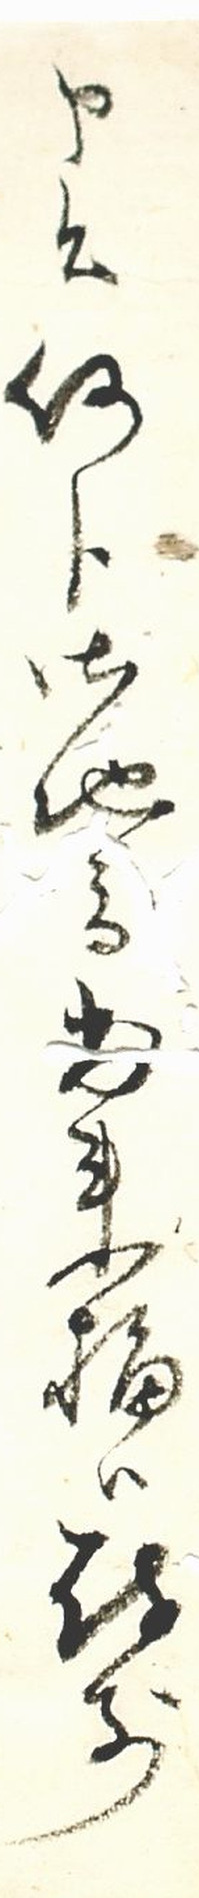申候何分御地に而出来桶は残前
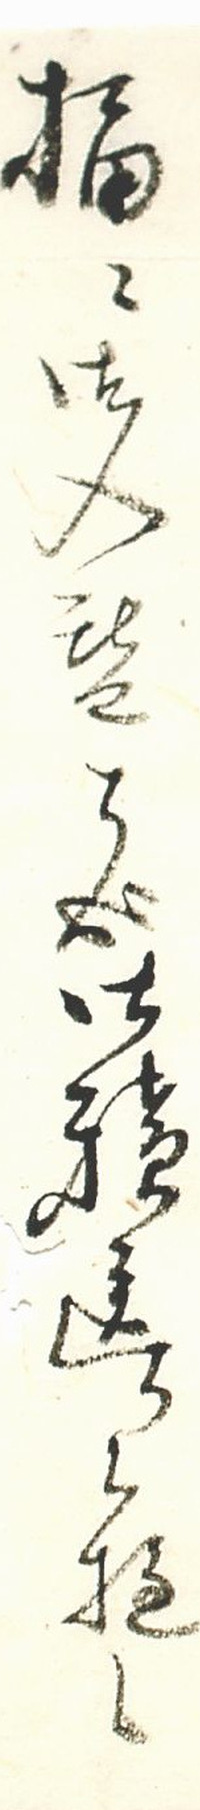桶に御入替被成御積送り被抱候
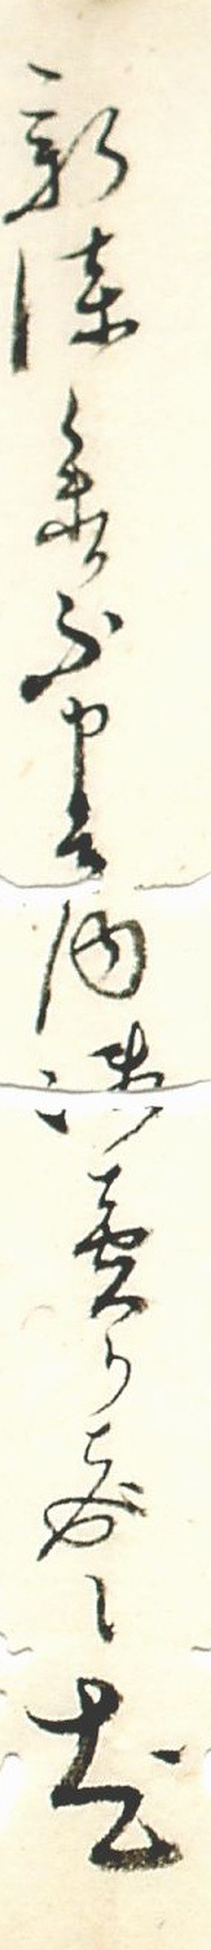新漆参り不申候内残売り被成候尤
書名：漆買捌方之事（漆売却約定書）
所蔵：鳴門教育大学 Naruto University of Education
